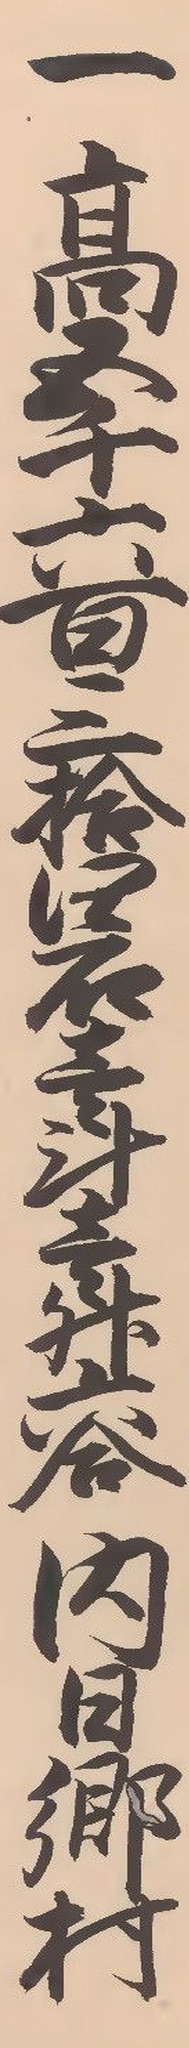一高五千六百三拾四石壱斗壱升六合内日郷村
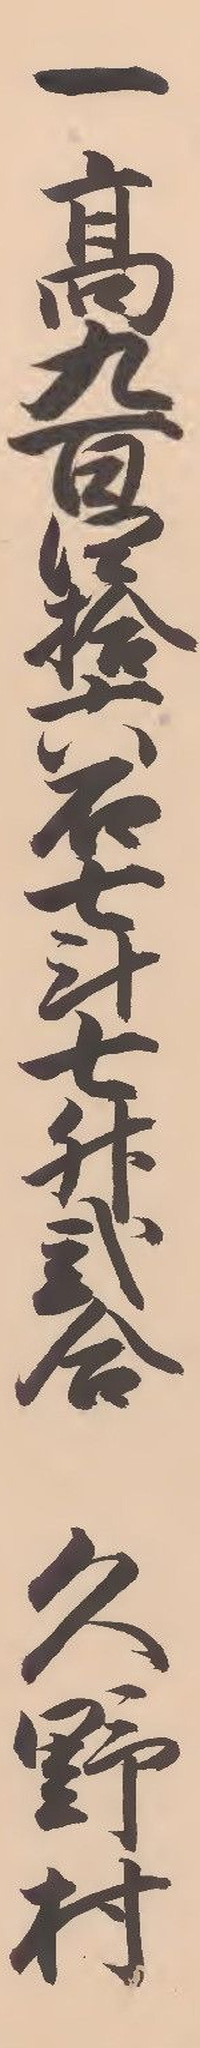一高九百四拾六石七斗七升弐合久野村

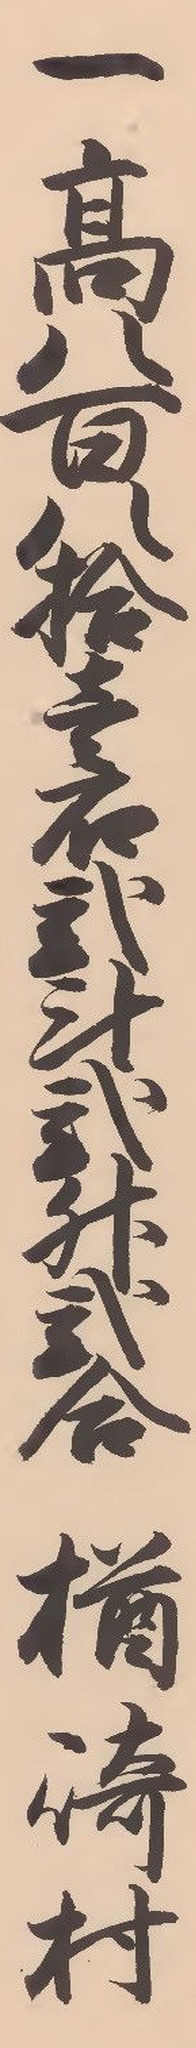一高八百八拾壱石弐斗弐升弐合楢崎村
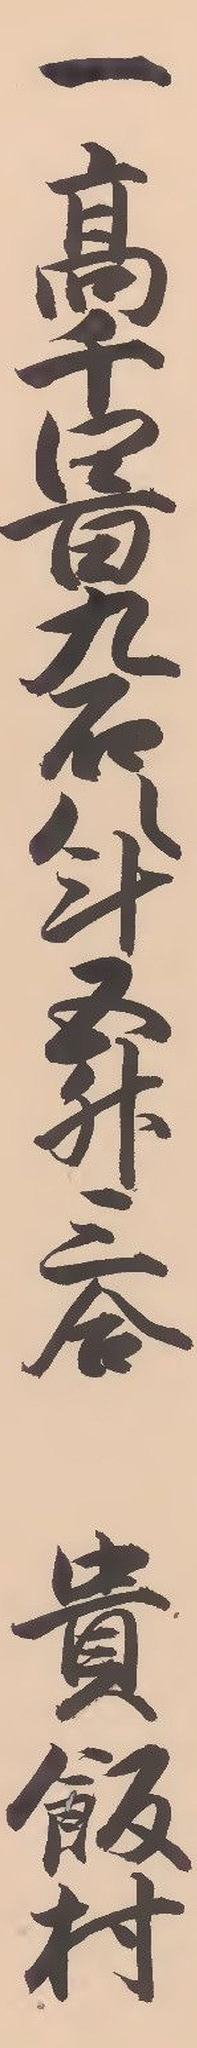一高千四百九石八斗五升三合貴飯村
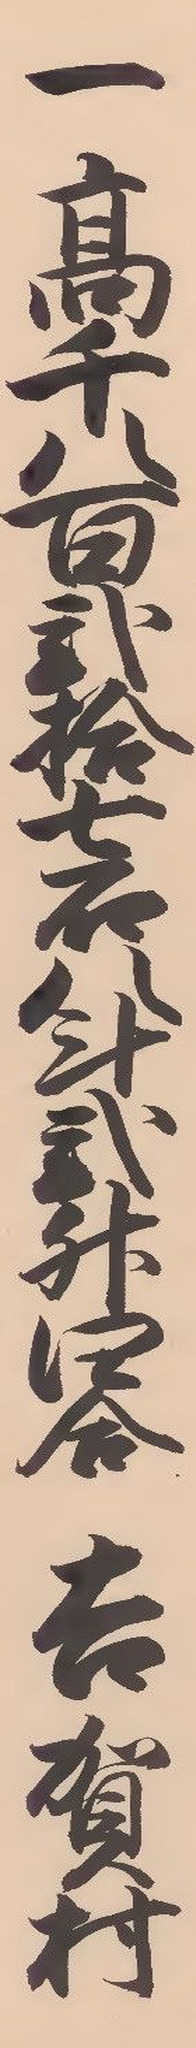一高千八百弐拾七石八斗弐升四合吉賀村
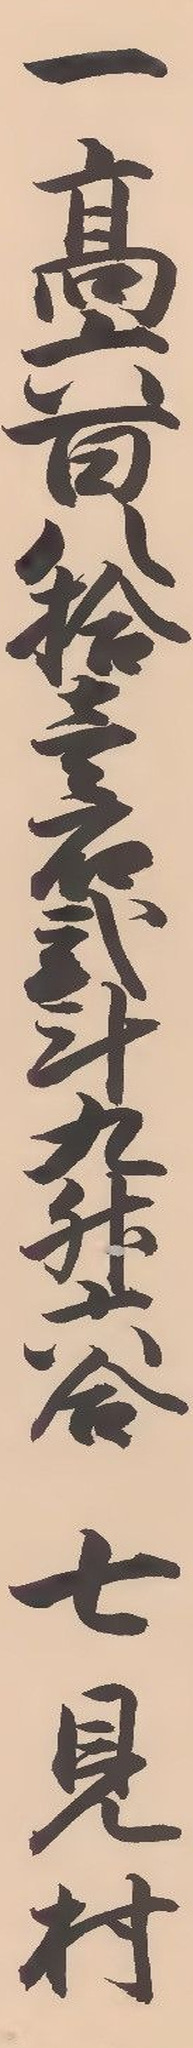一高六百八拾壱石弐斗九升六合七見村
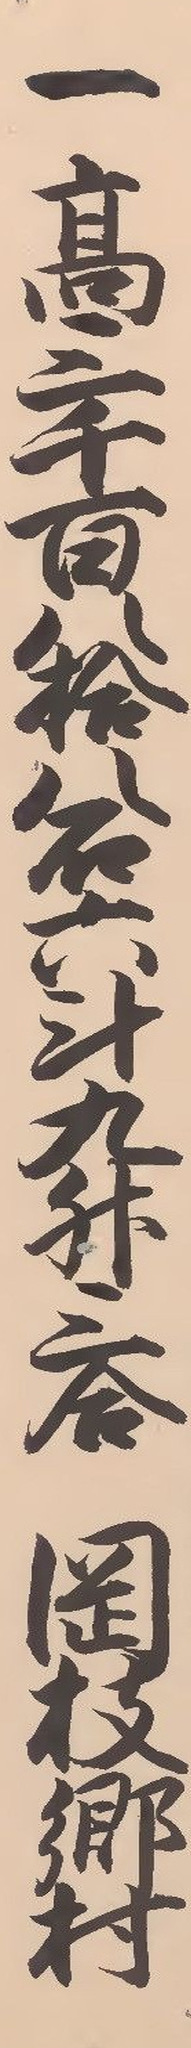一高三千百八拾八石六斗九升三合岡枝郷村
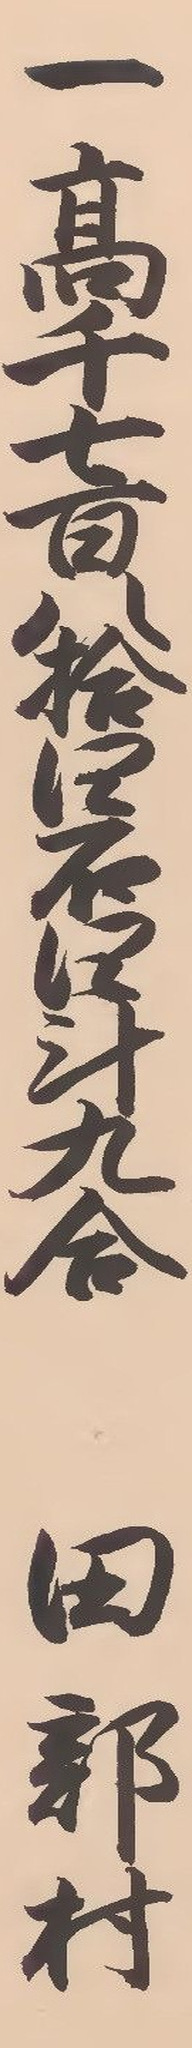一高千七百八拾四石四斗九合田部村
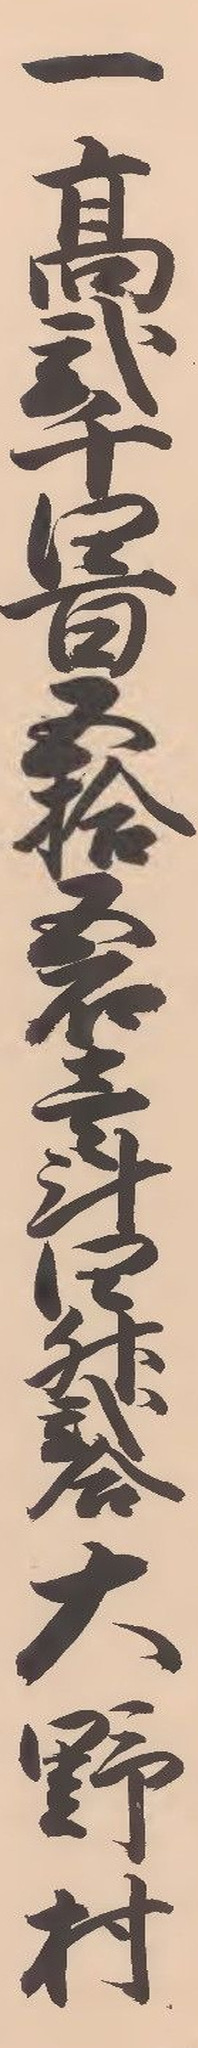一高弐千四百五拾五石壱斗四升弐合大野村
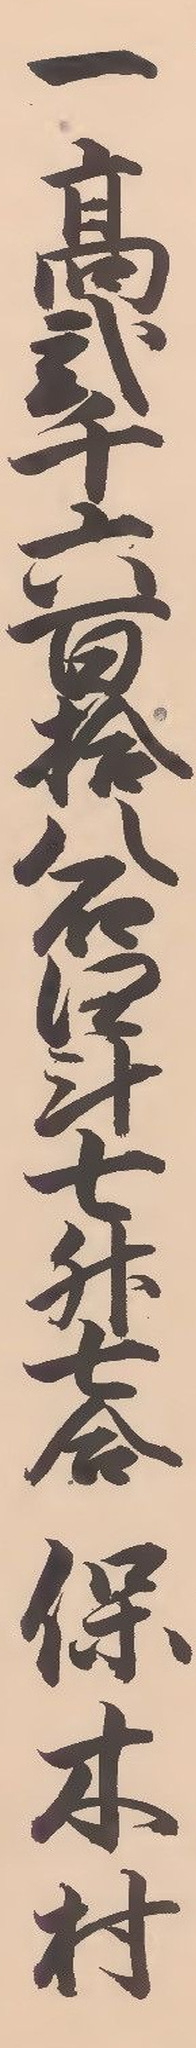一高弐千六百拾八石四斗七升七合保木村

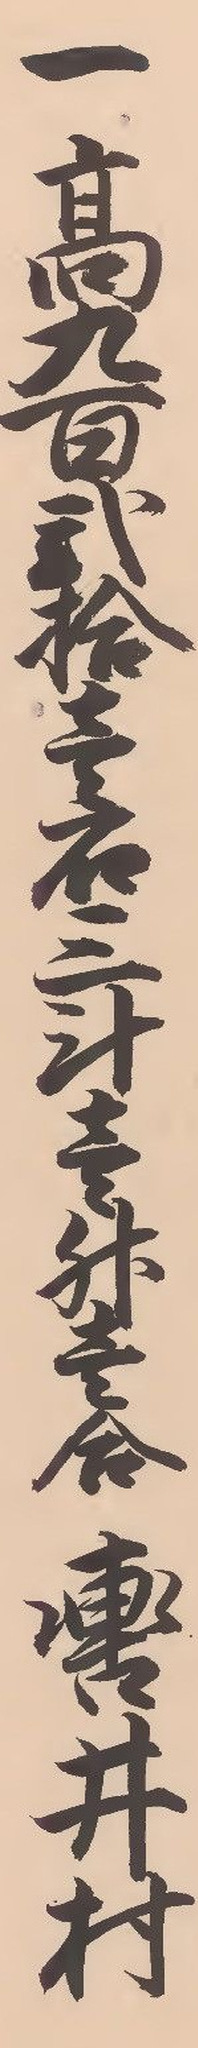一高九百弐拾壱石三斗壱升壱合轡井村
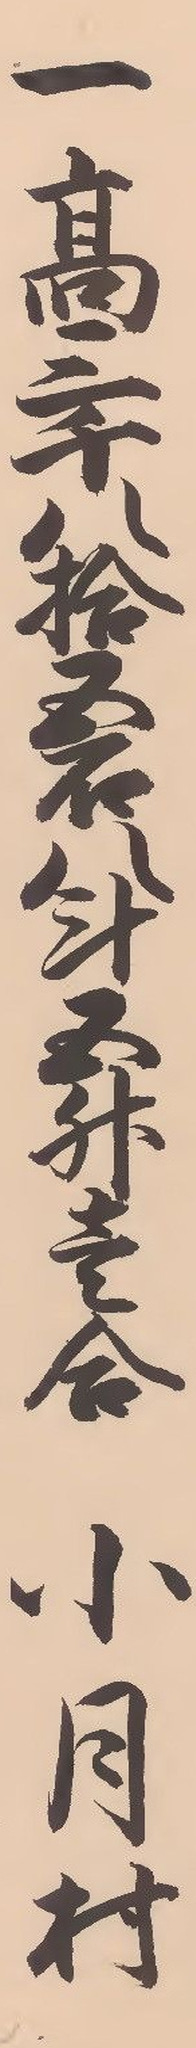一高三千八拾五石八斗五升壱合小月村
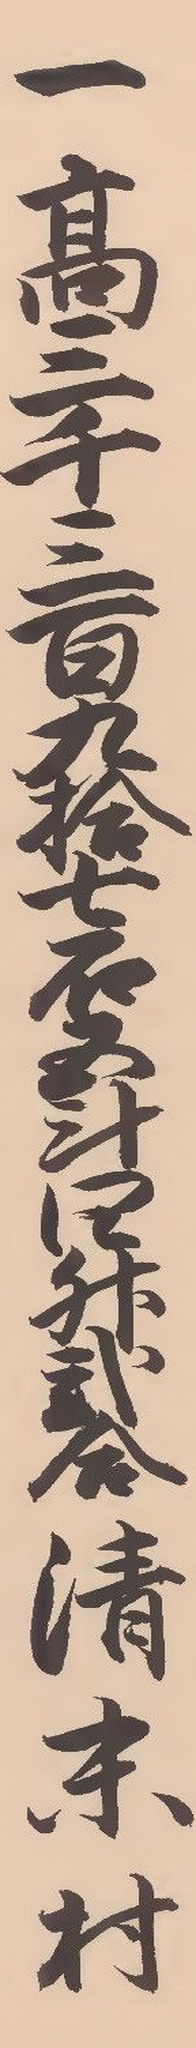一高三千三百九拾七石五斗四升弐合清末村
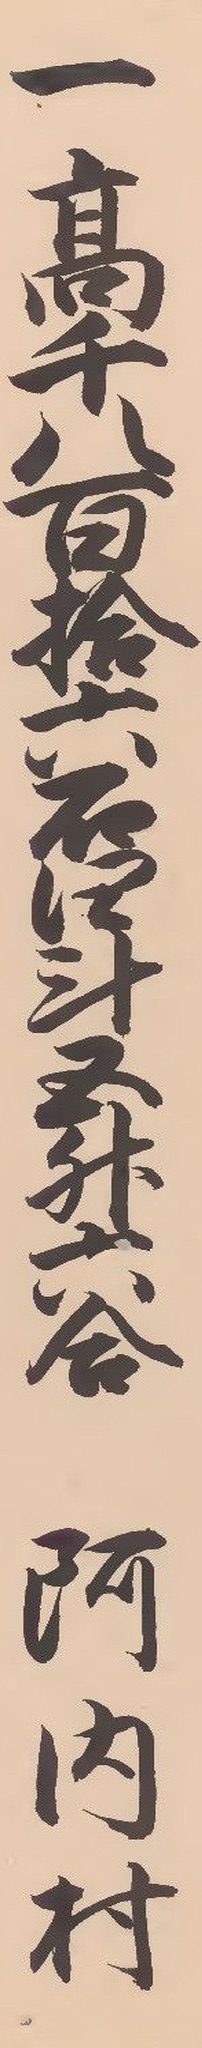一高千八百拾六石四斗五升六合阿内村
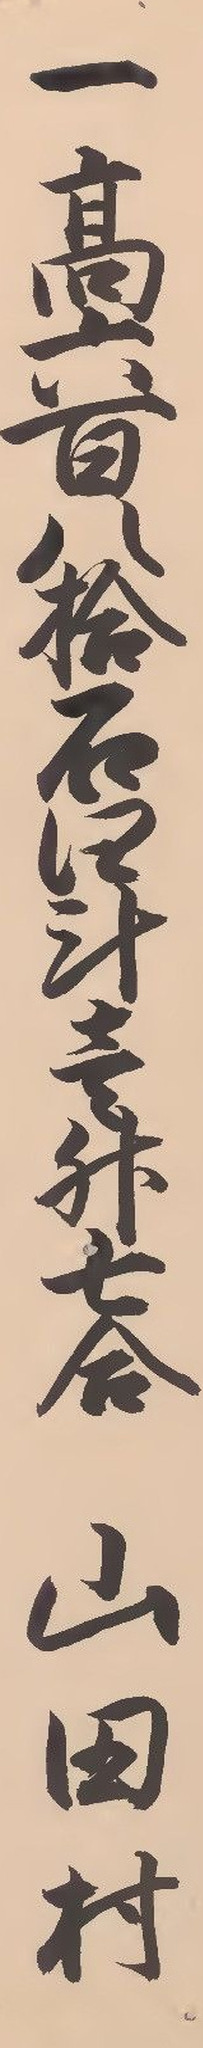一高六百八拾石四斗壱升七合山田村
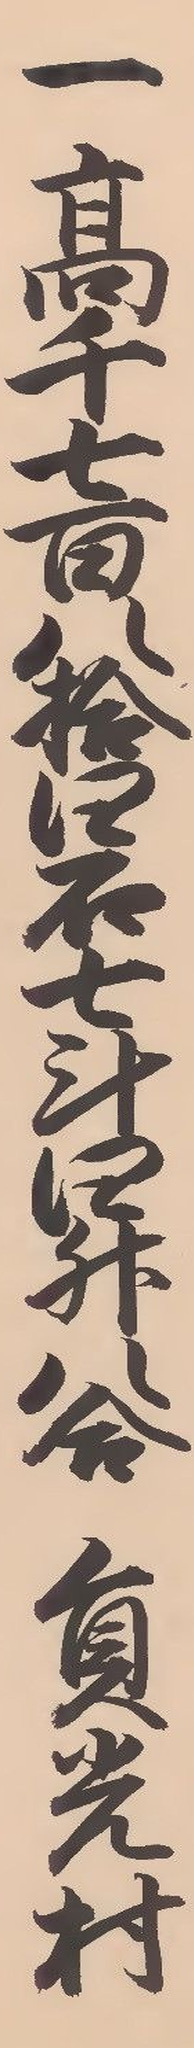一高千七百八拾四石七斗四升八合員光村
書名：長門国郷帳
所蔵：国立公文書館 National Archives of Japan
